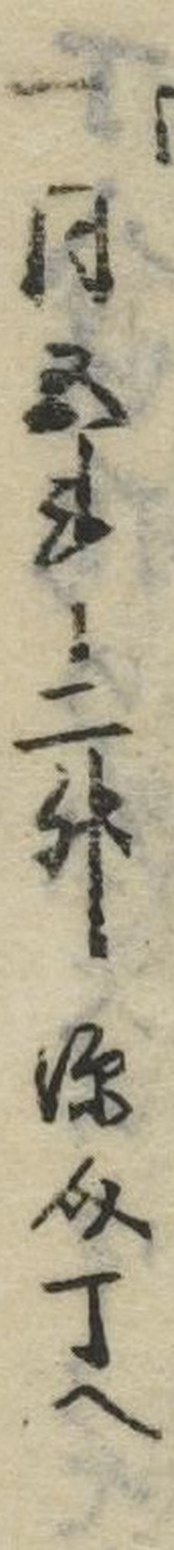一同五斗二升源介丁へ
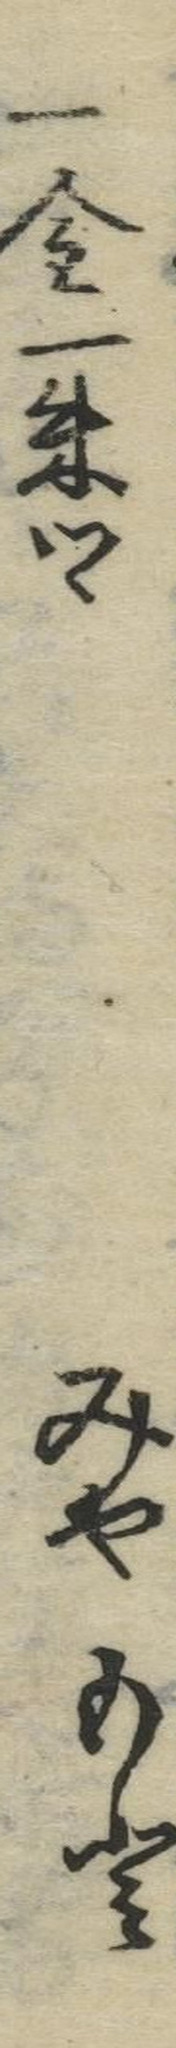一金一朱ツゝみやもと
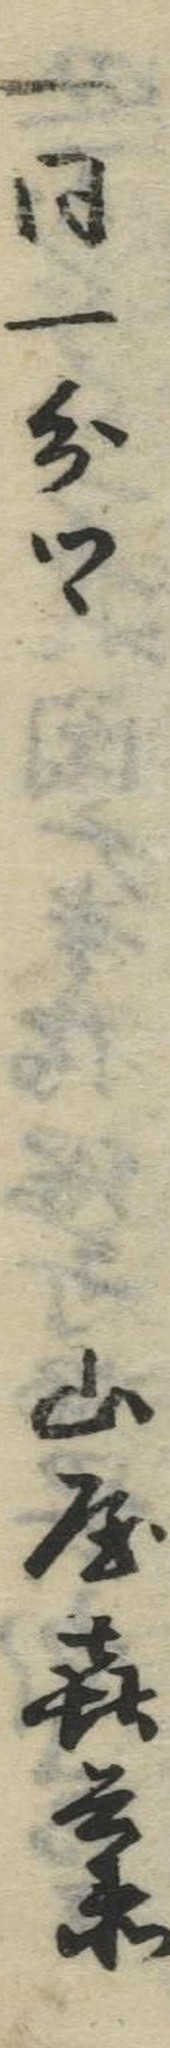一金一分ツゝ山屋喜兵衛
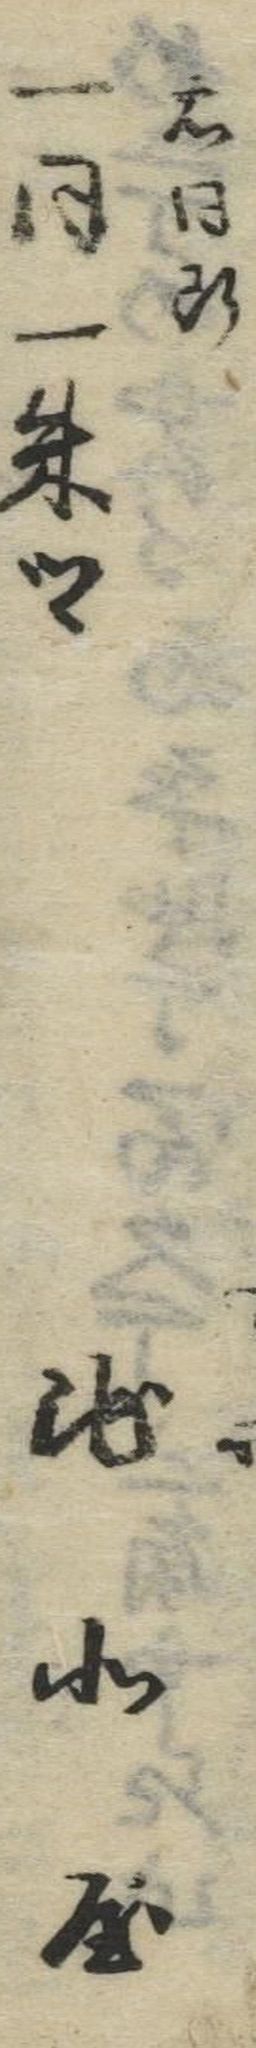一同一朱ツゝ池北屋
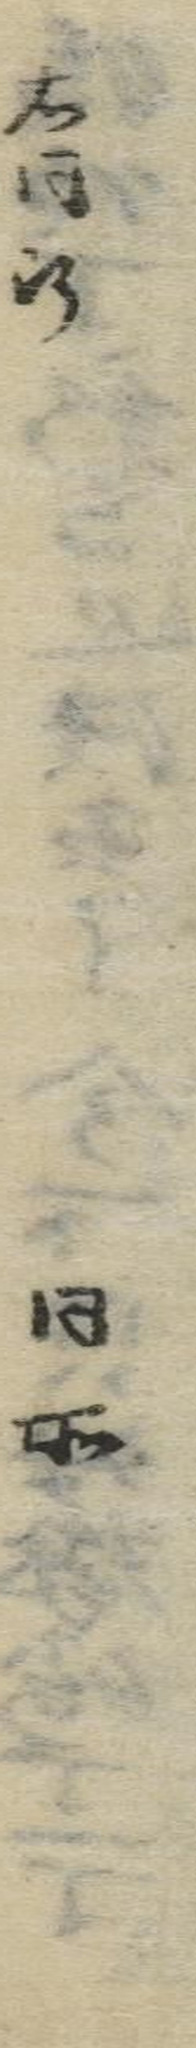右同断同所
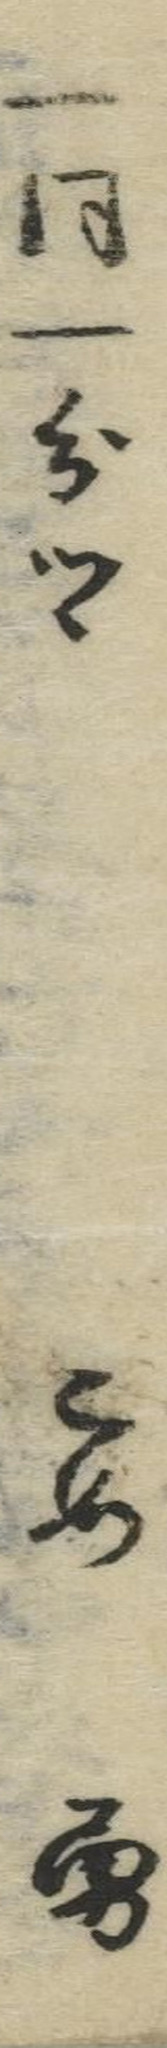一一分ツゝこめ勇
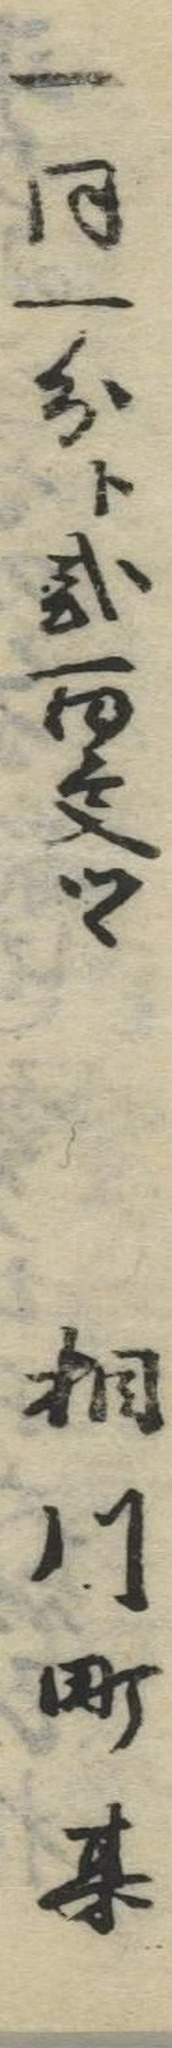一同一分ㇳ弐百文ツゝ相川町某
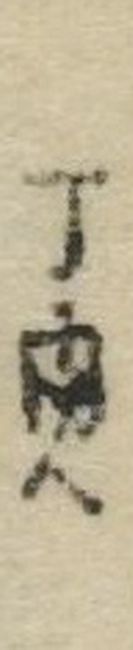丁内へ
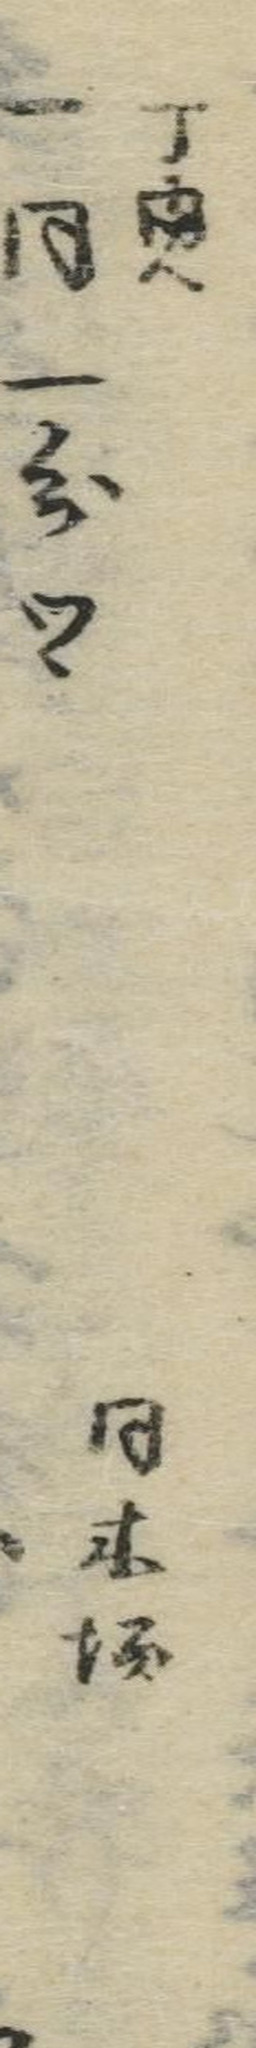一同一分ツゝ同木場
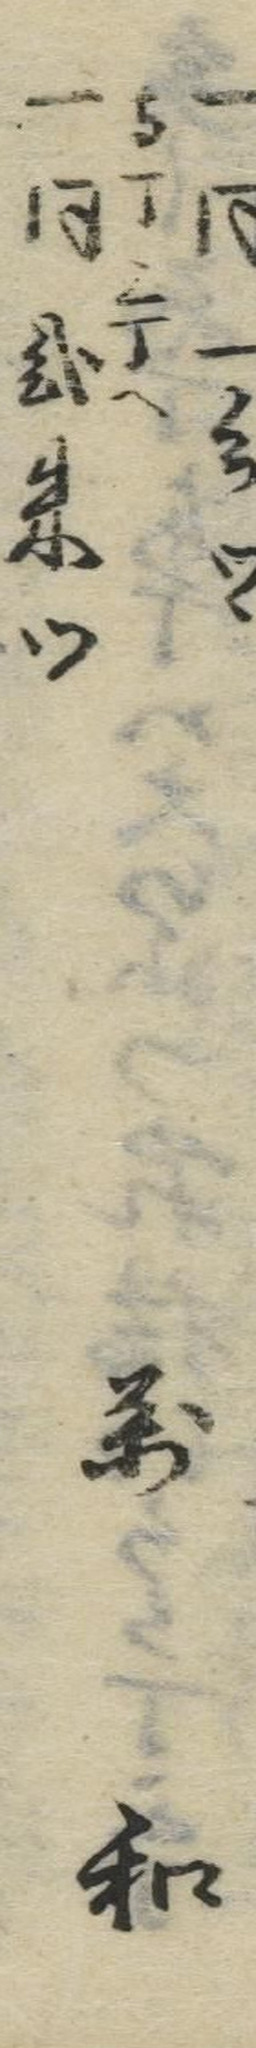一同弐朱ツゝ本惣
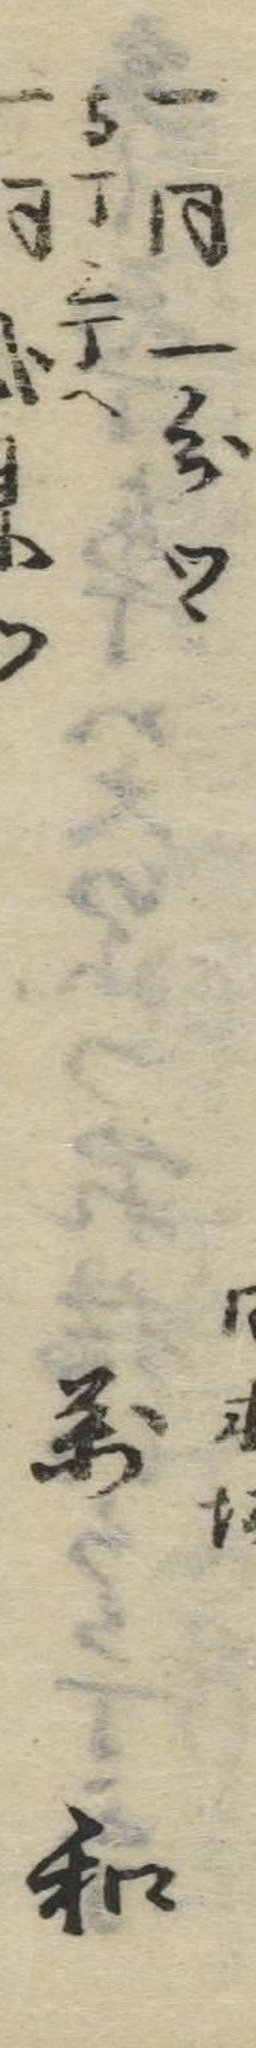一同二朱ツゝ萬和
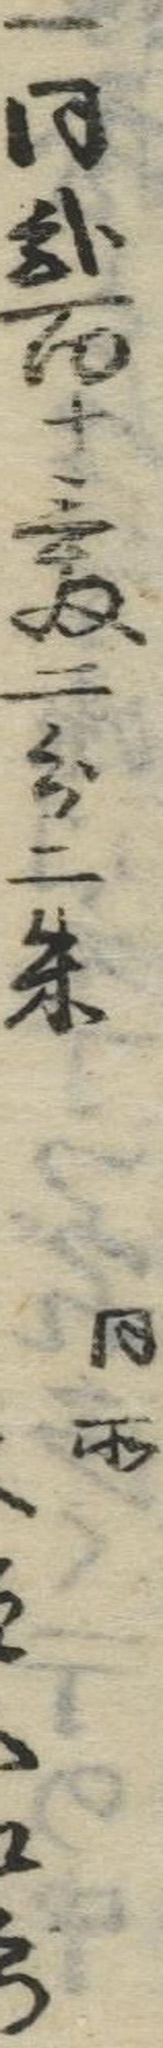一同弐百十三両二分二朱同所
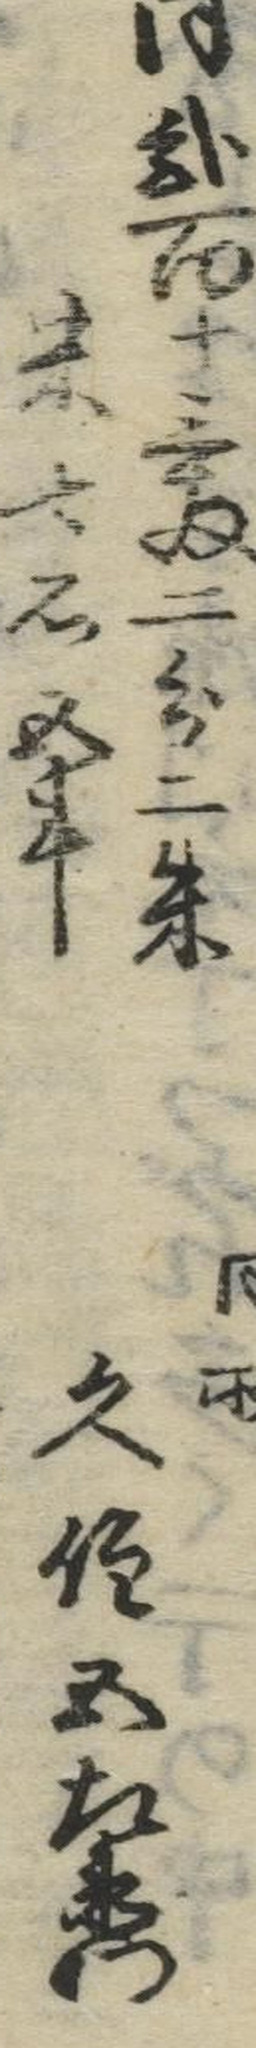米七石五斗久住五左衛門
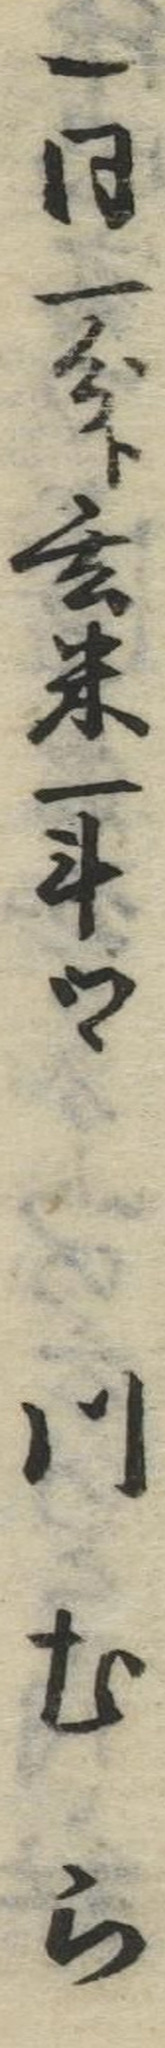一同一分ㇳ玄米一斗ツゝ川むら
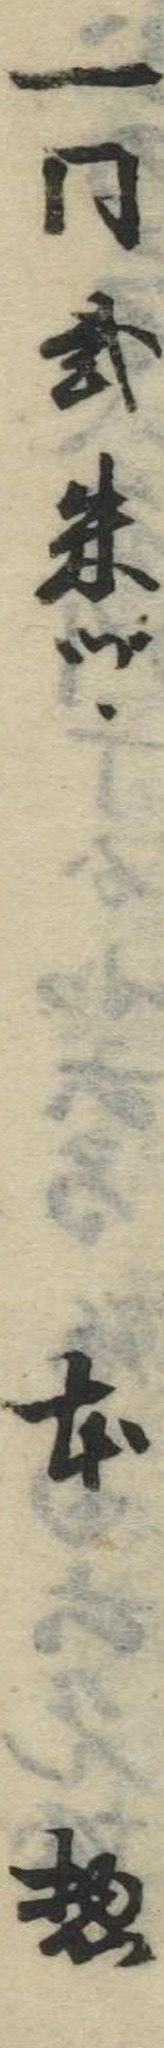一同弐朱ツゝ本惣
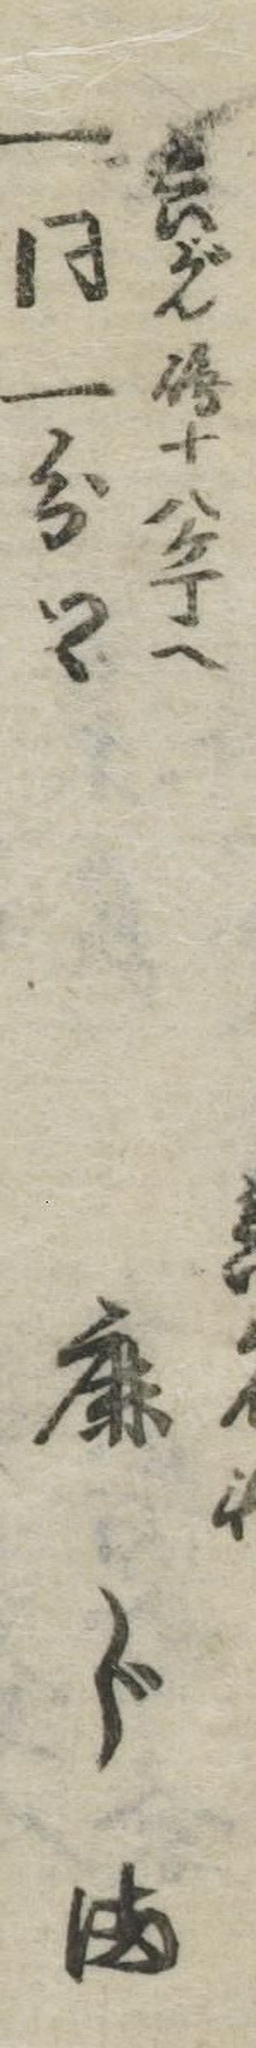一同一分ツゝ同木場
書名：安政二卯十月二日夜四ツ時過　御府内御屋敷方市中共　地震類焼場所明細書之寫　并街道筋近郷聞書
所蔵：東京大学地震研究所図書室 Earthquake Research Institute Library, The University of Tokyo, JAPAN
